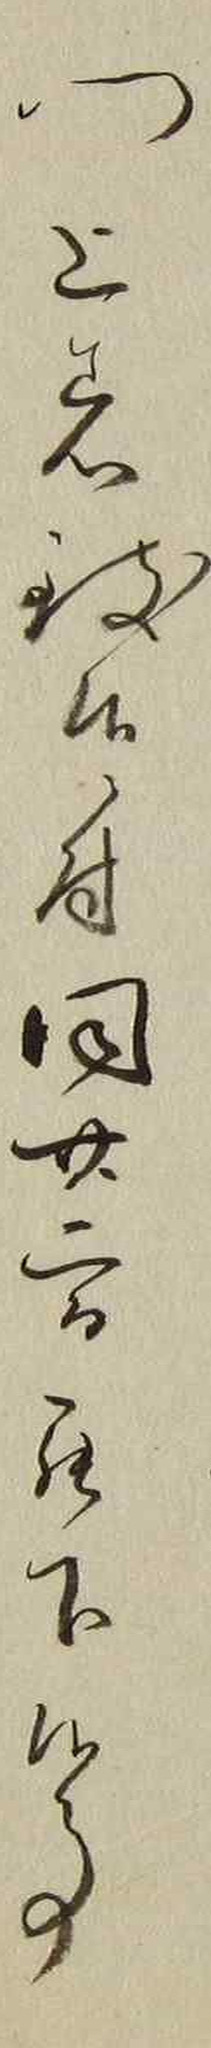門上着致候ニ付同廿二日罷下候事
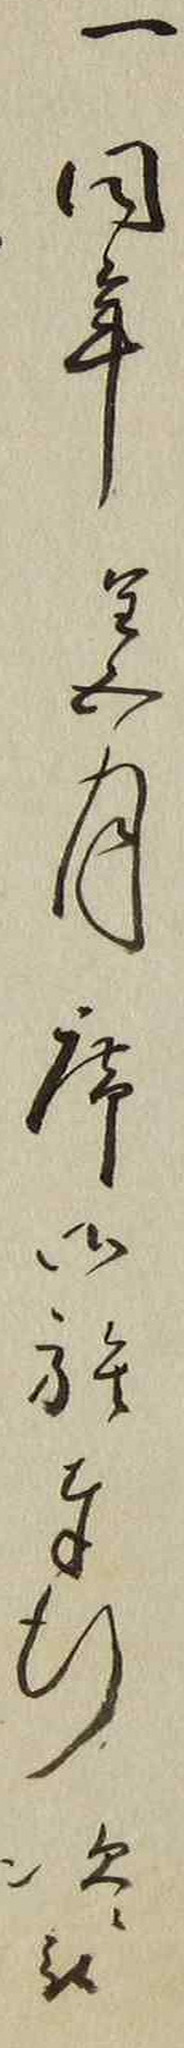一同年閏五月席御旗奉行次ニ被
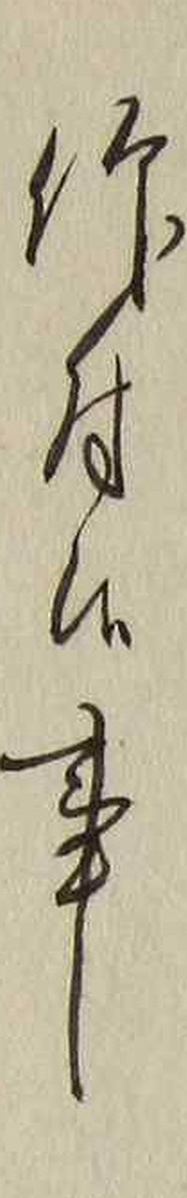仰付候事
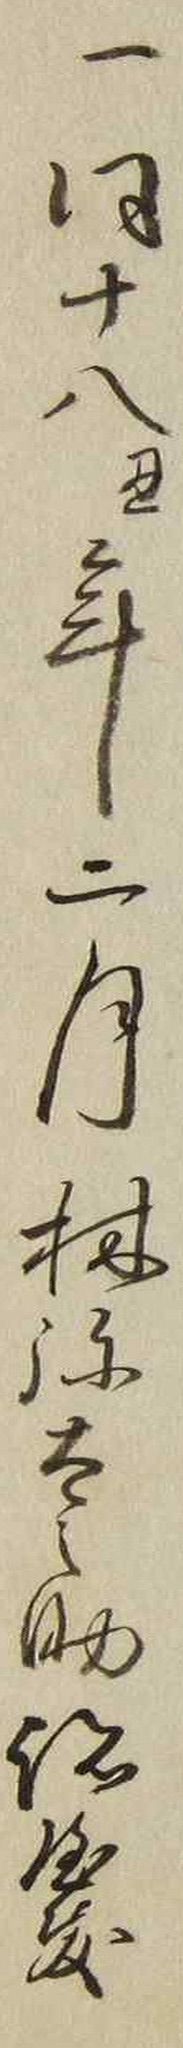一同十八丑年二月林弥太之助跡屋敷

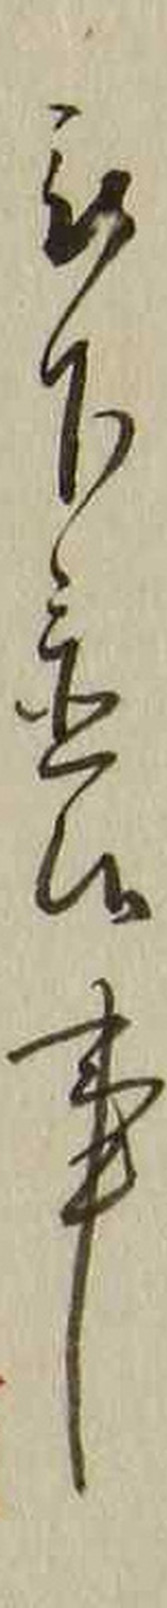被下置候事
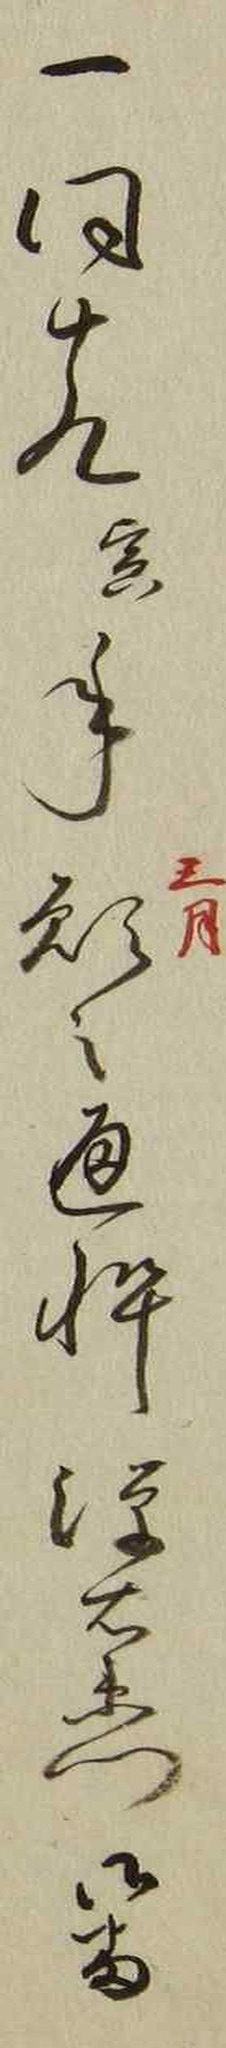一同十九寅年三月願之通忰源右衛門御番
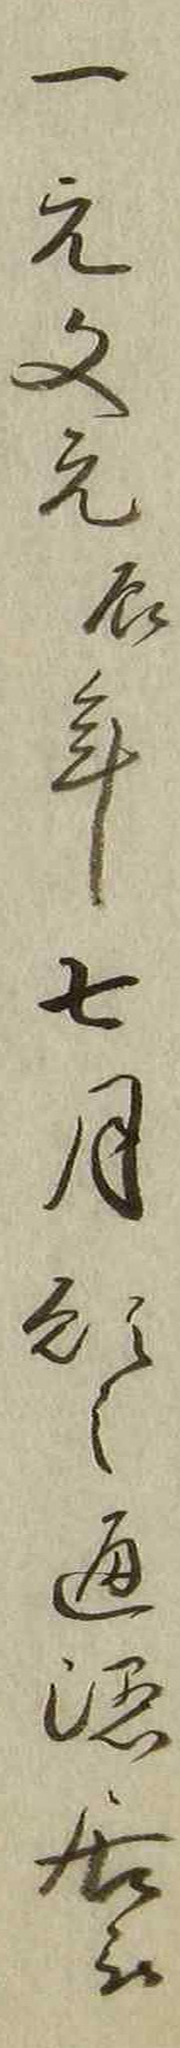一元文元辰年七月願之通隠居被
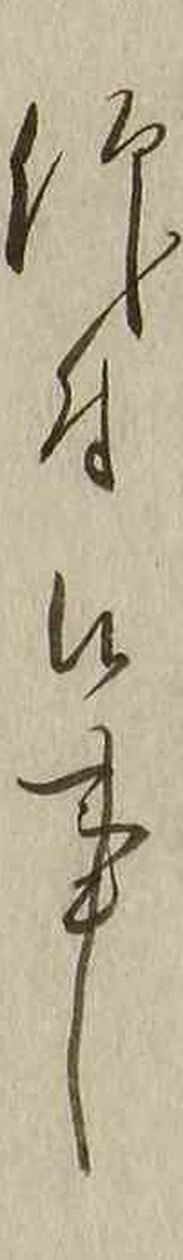仰付候事
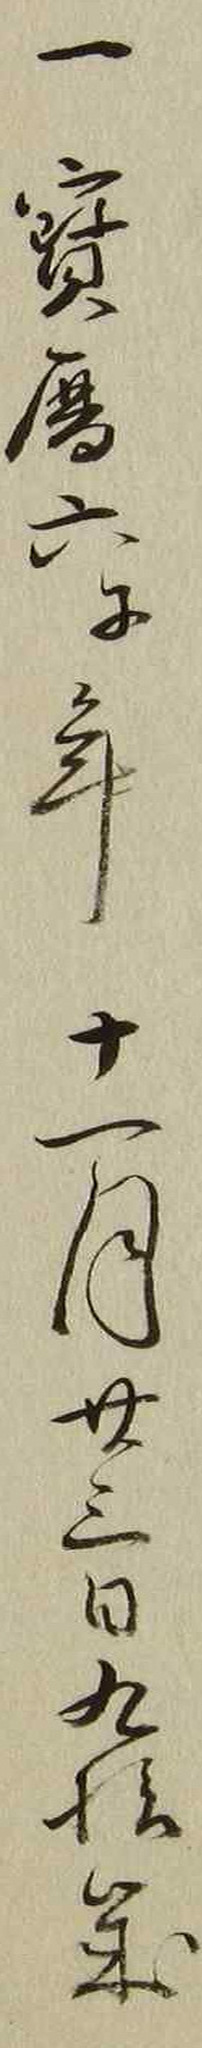一宝暦六子年十一月廿三日九拾歳
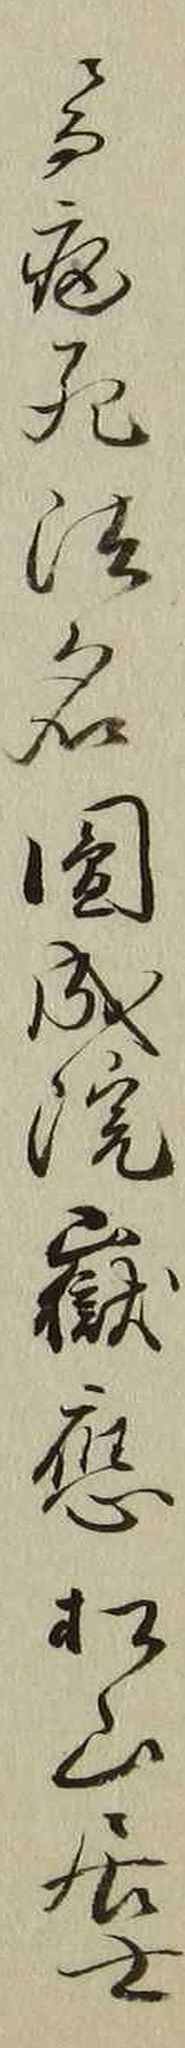ニ而病死法名円成院嶽応松山居士
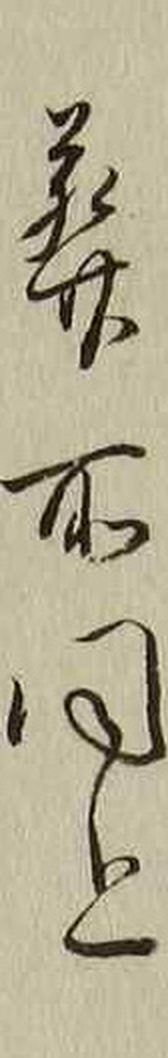葬所同上
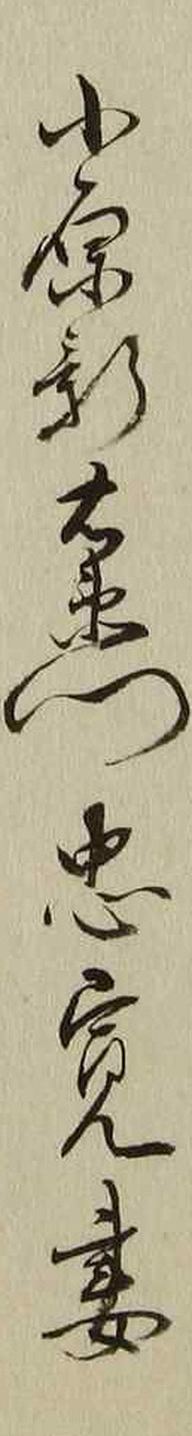女小原新右衛門忠寛妻
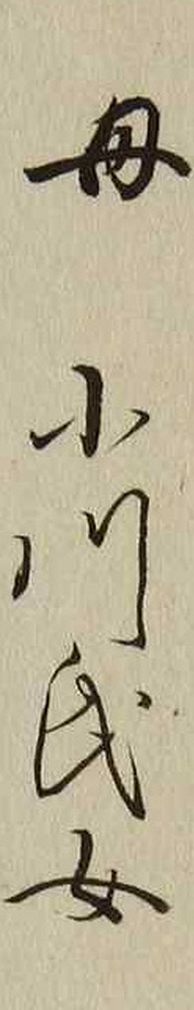母小川氏女
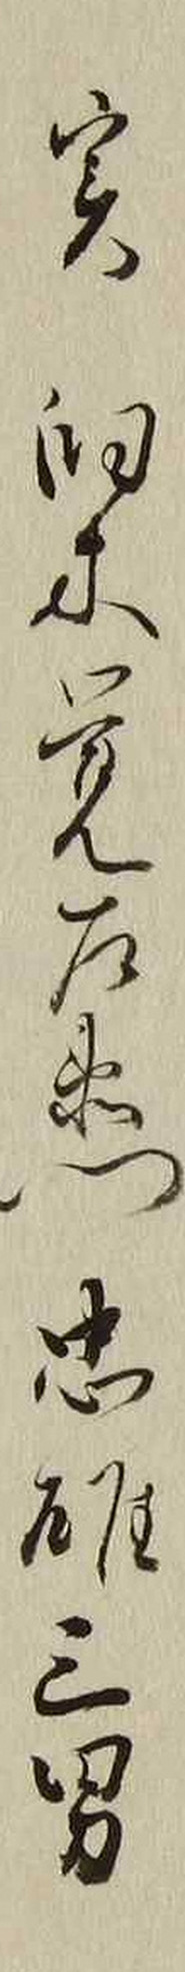実臼木覚左衛門忠雄三男
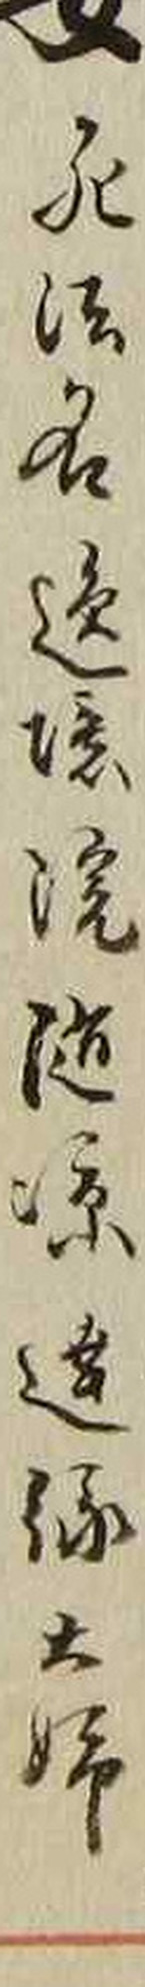死法名逸境院随凉達縁大姉
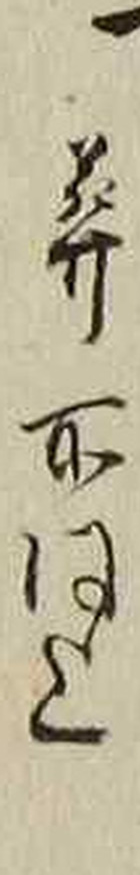葬所同上
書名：諸士系譜　巻之2　い之部2
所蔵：会津若松市立会津図書館
